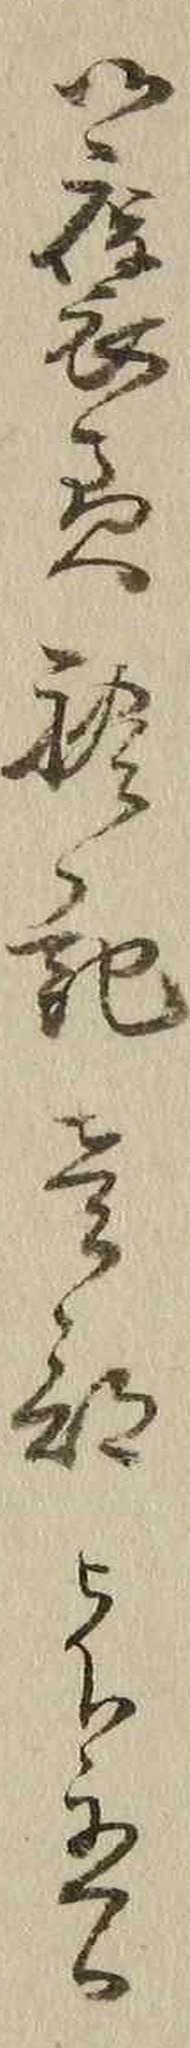御褒美礼記壱部被下置候
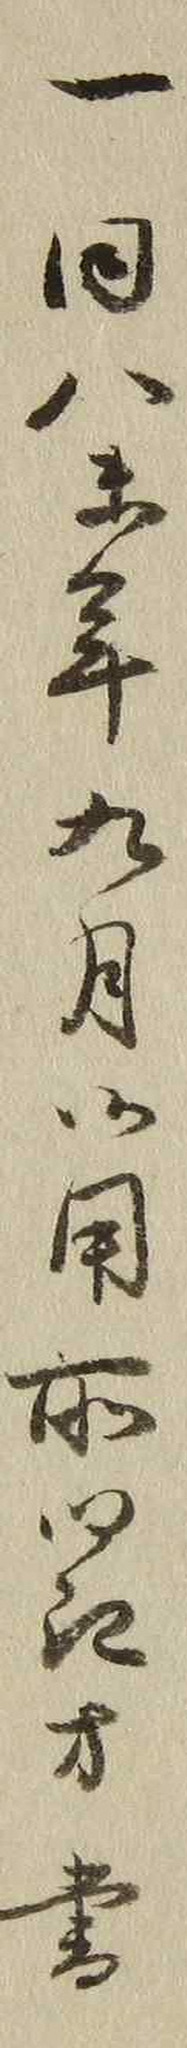一同八未年九月御用所御取方書
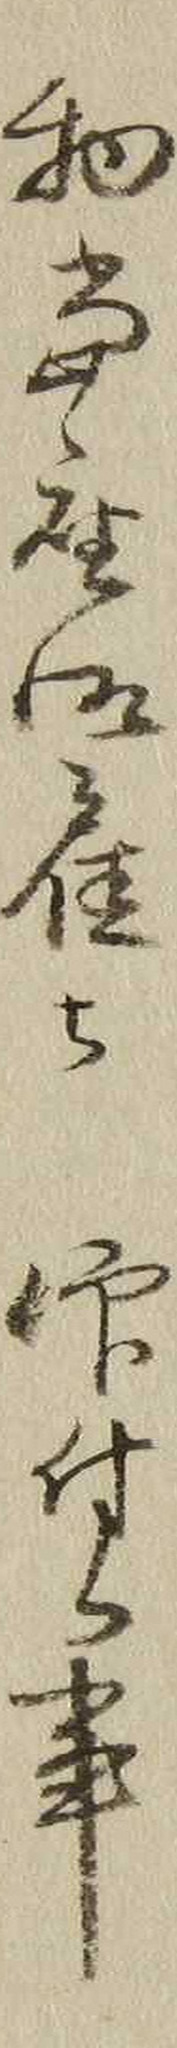物当座御雇被仰付候事
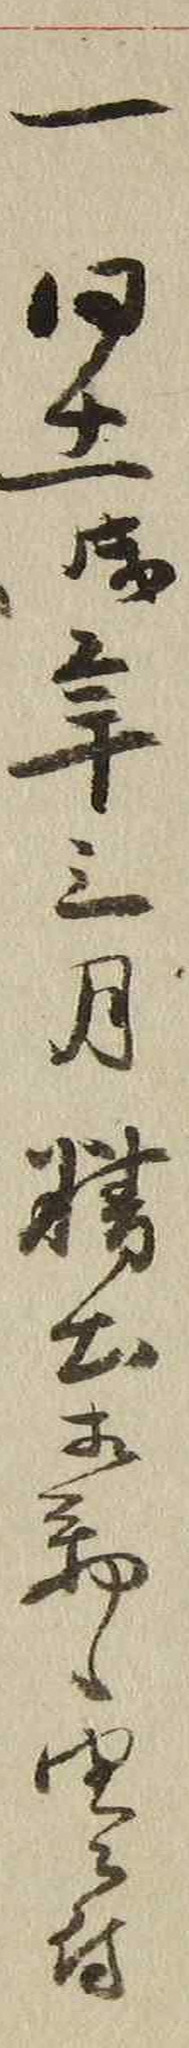一同十一戌年三月精出相勤候由ニ付
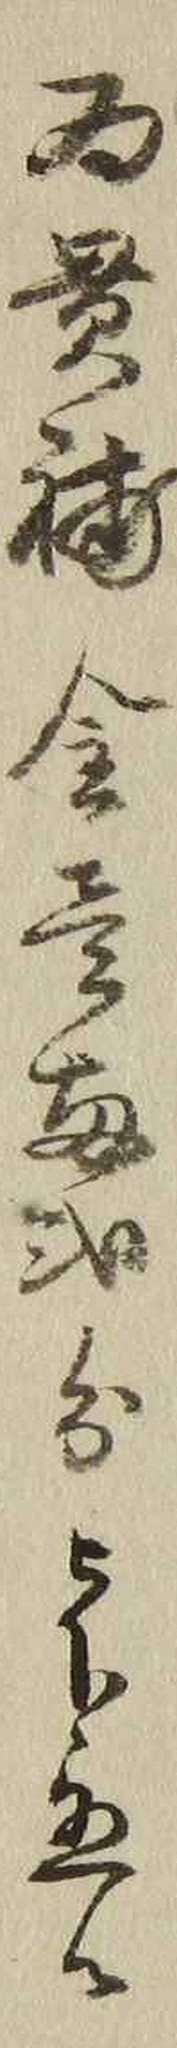為費補金壱両弐分被下置候
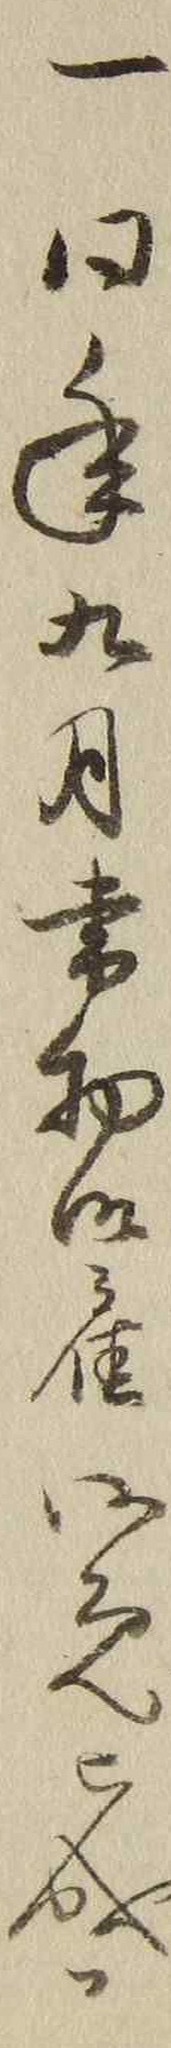一同年九月書物御雇御免被成候

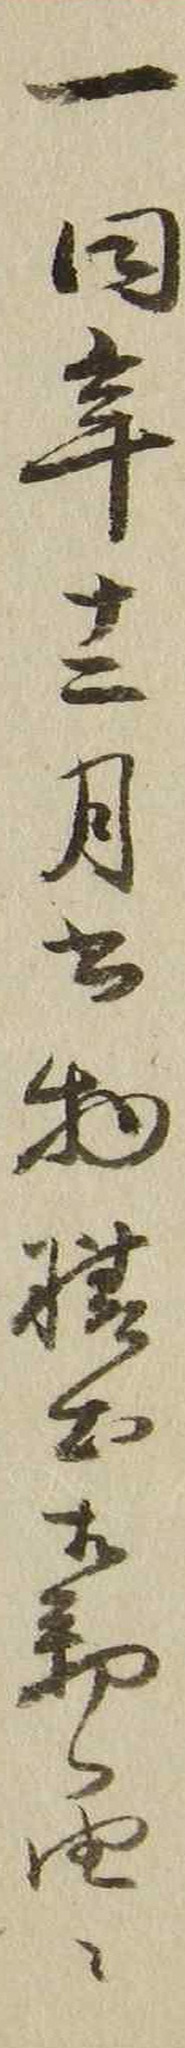一同年十二月書物精出相勤候由ニ
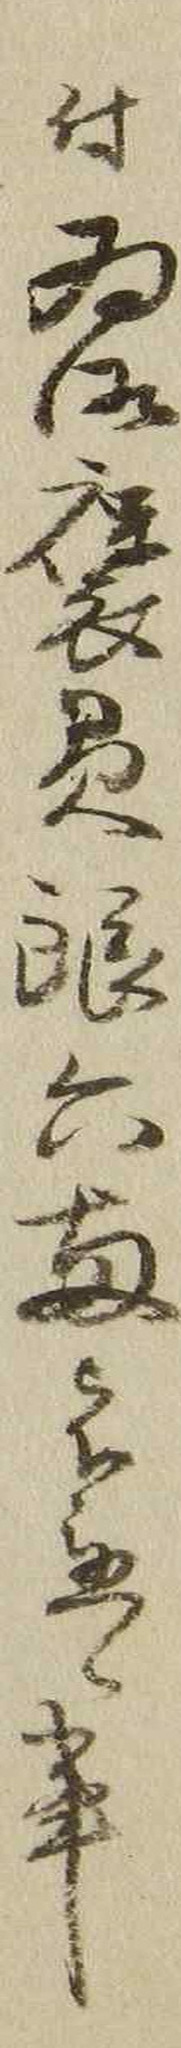付為御褒美銀六両被下置候事
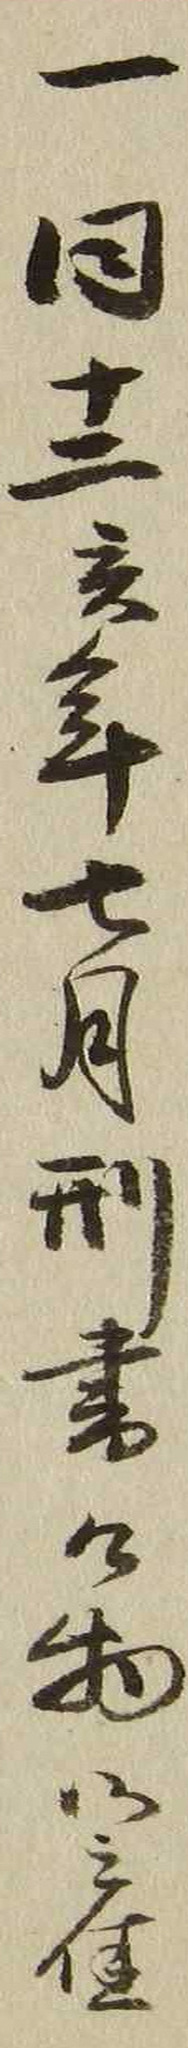一同十二亥年七月刑書々物御雇
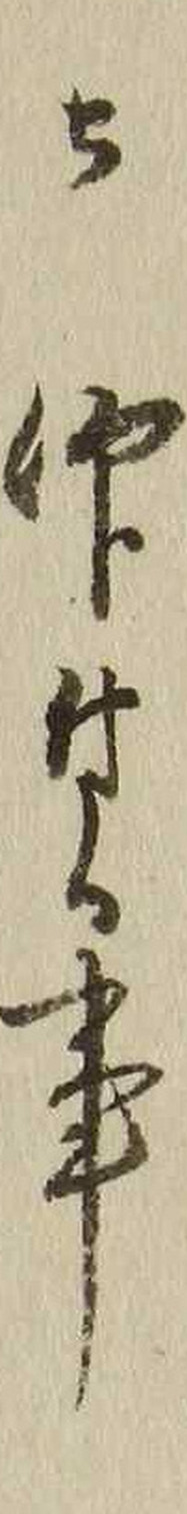被仰付候事
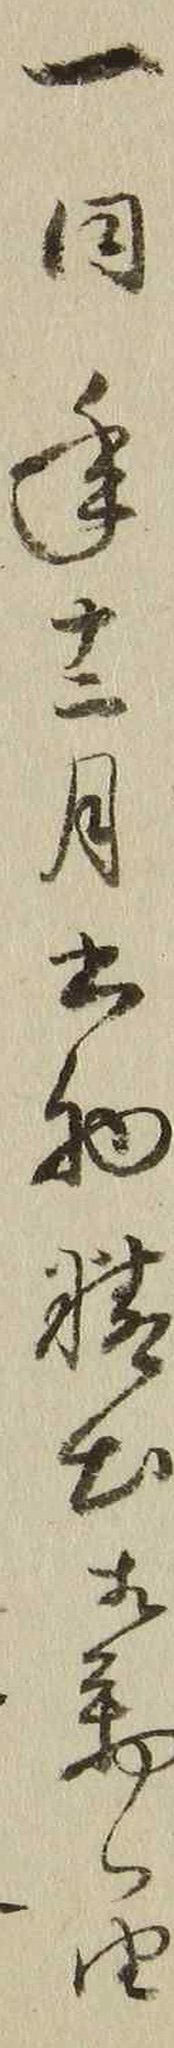一同年十二月書物精出相勤候由
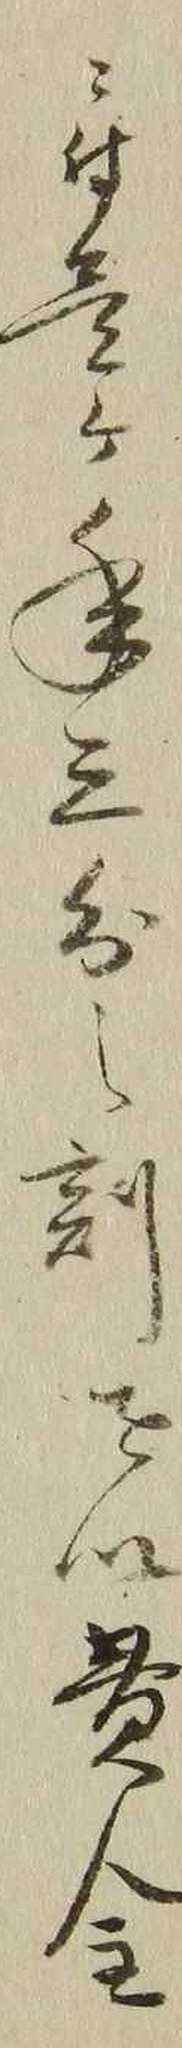ニ付壱ヶ年三分之割を以費金
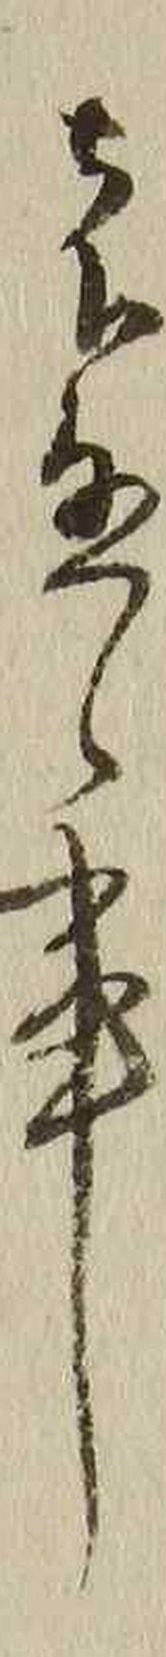被下置候事
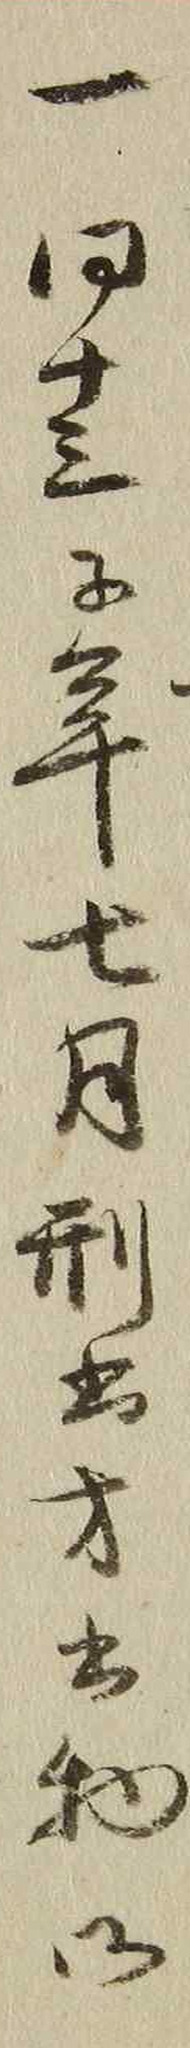一同十三子年七月刑書方書物御
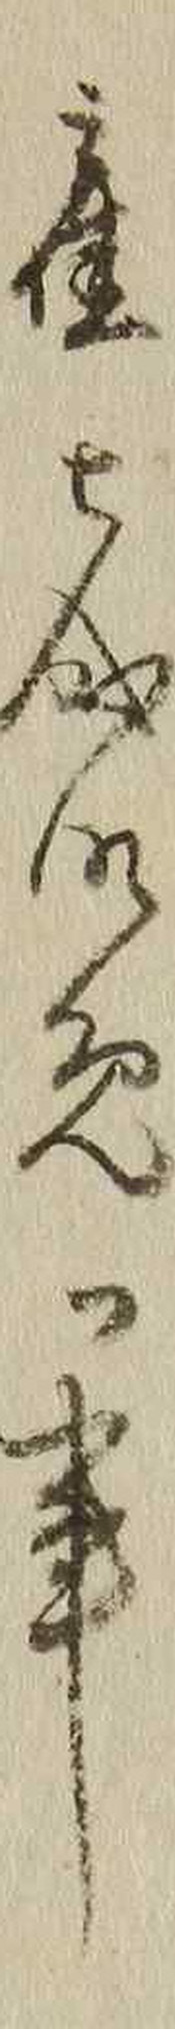雇被成御免候事
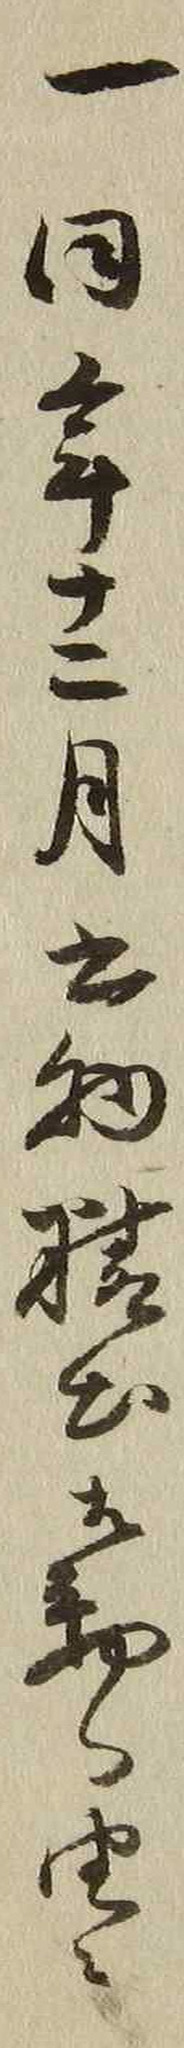一同年十二月書物精出相勤候由ニ
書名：諸士系譜　巻之236　ふ之部4
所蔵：会津若松市立会津図書館
